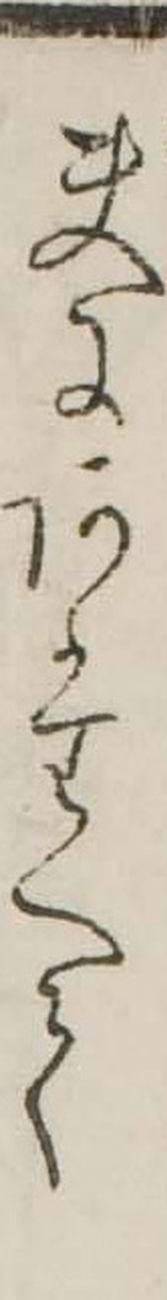夫にあたへて
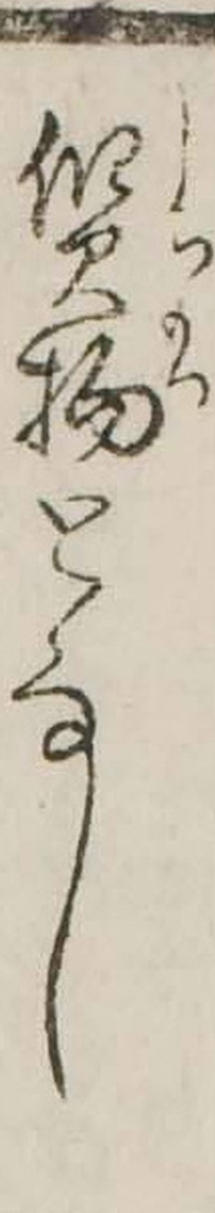質物となし
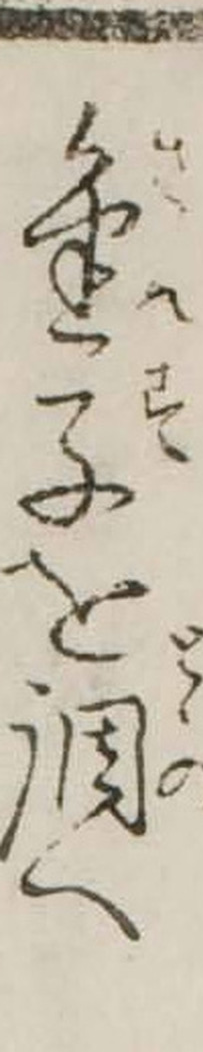金子を調へ
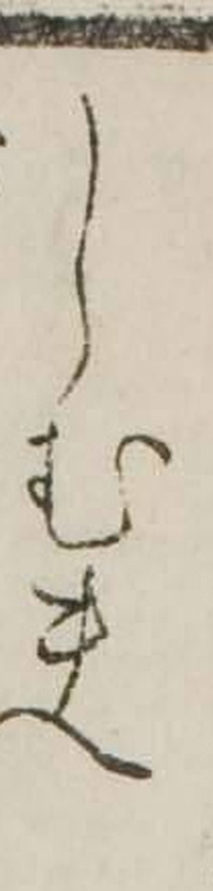しむ夫
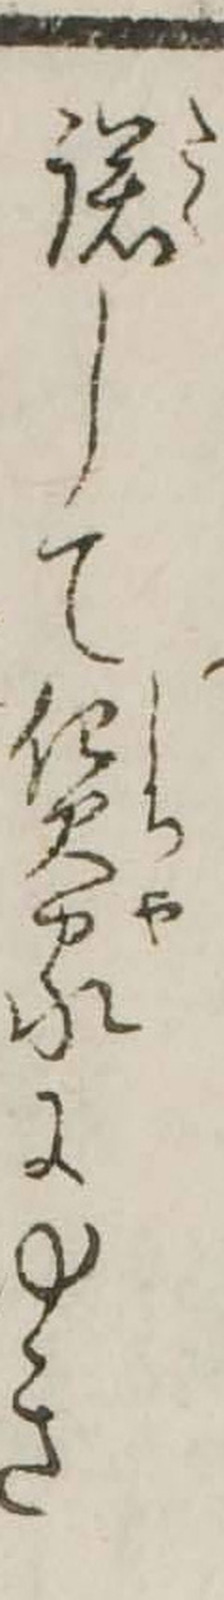諾して質家にゆき
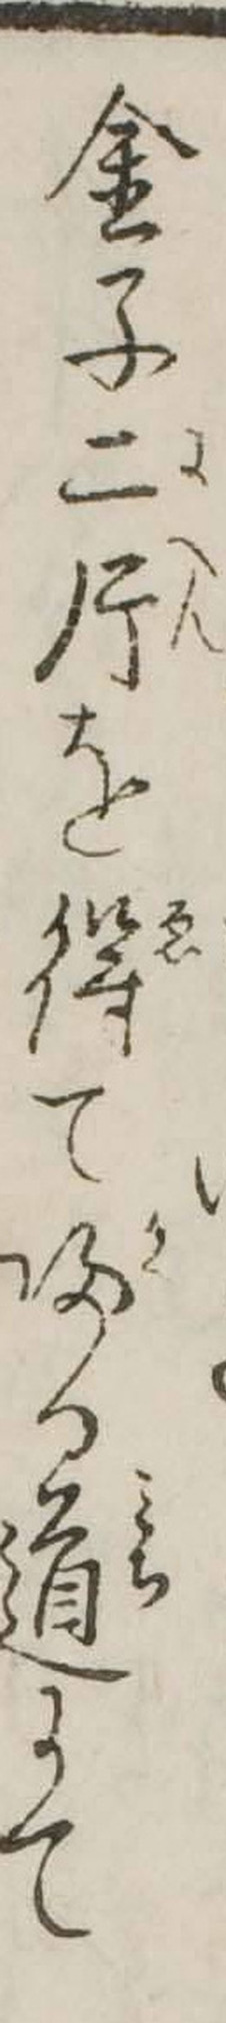金子二片を得て帰る道にて
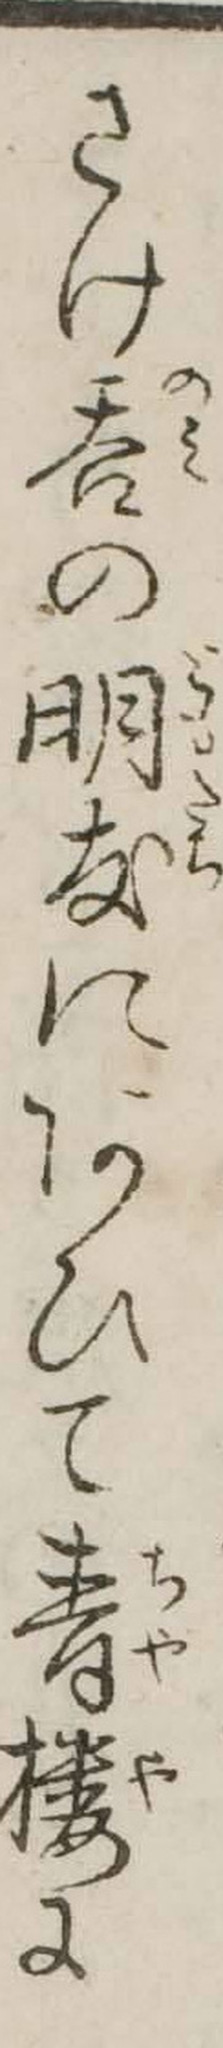さけ吞の朋友にあひて青楼に
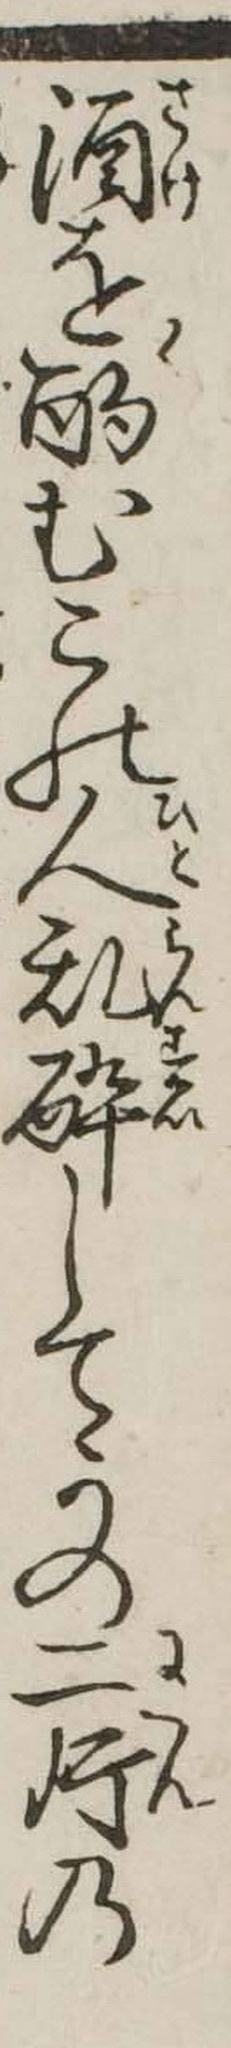酒を酌むこの人乱酔してかの二片の
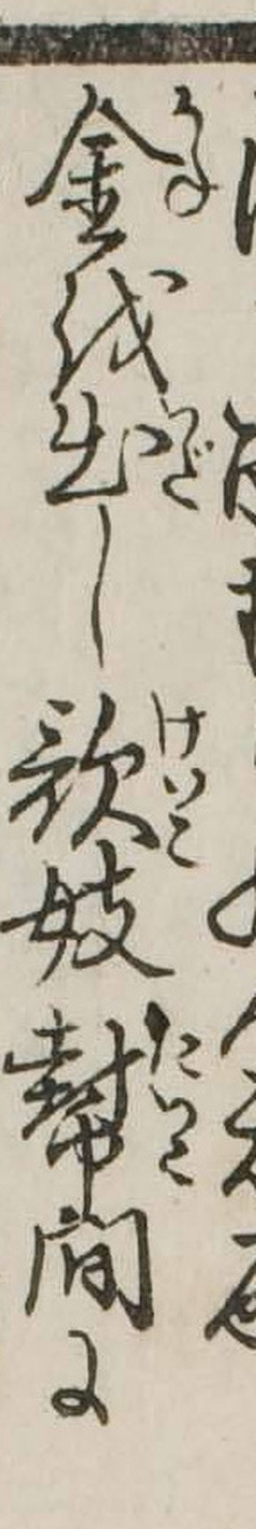金を出し歌妓幇間に
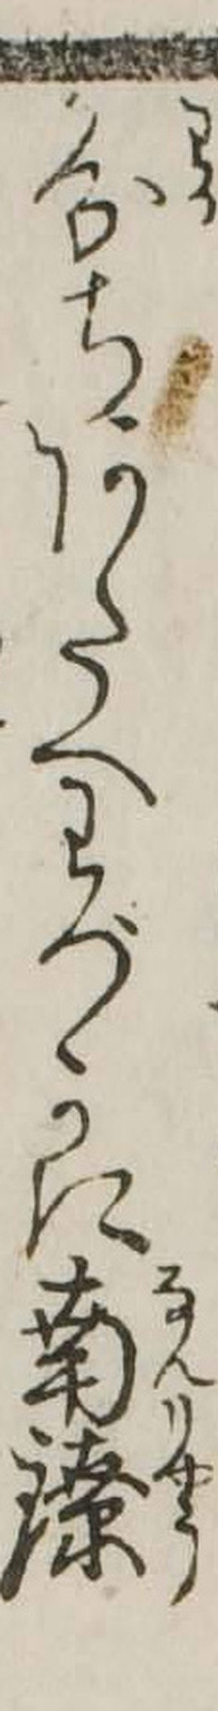分ちあたへわづかに南鐐
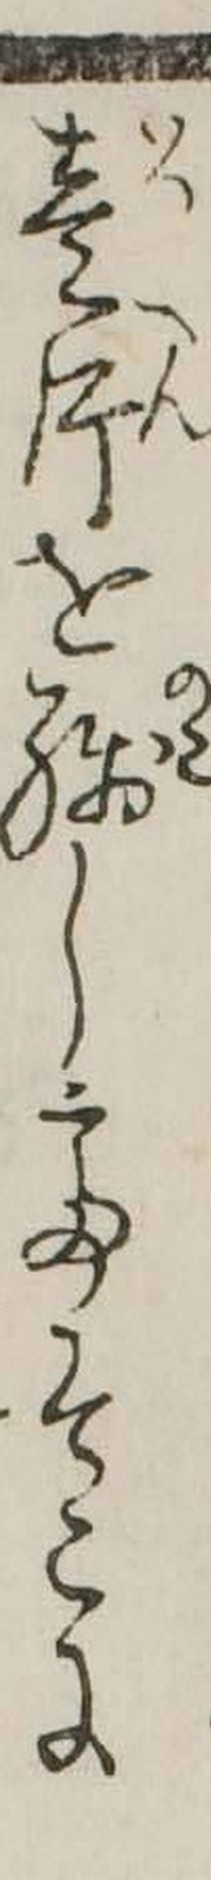壱片を残してそこに
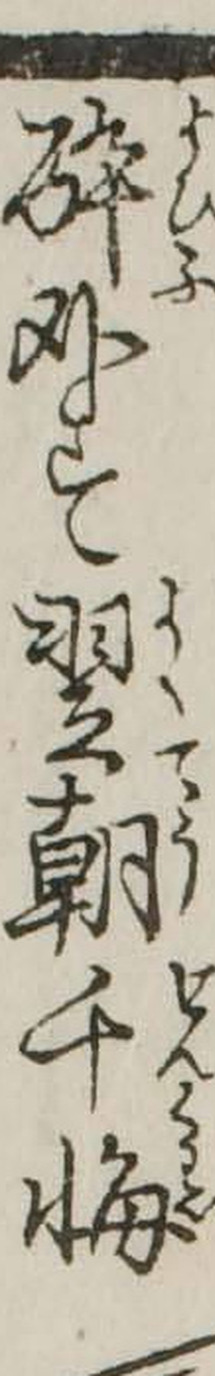酔臥す翌朝千悔
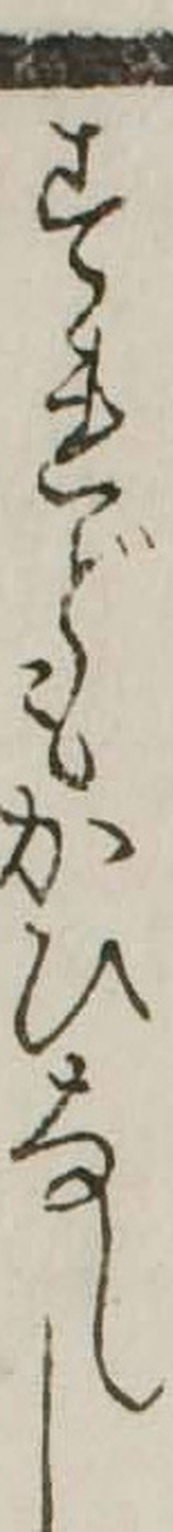すれどもかひなし
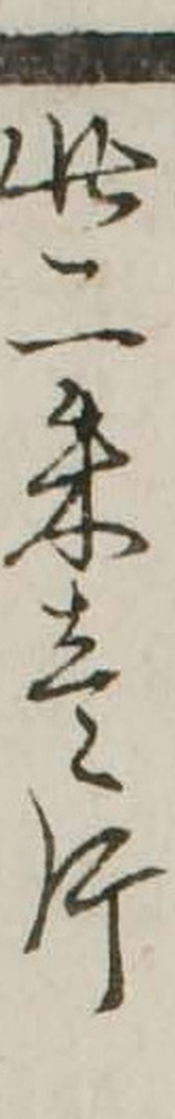此二朱一片
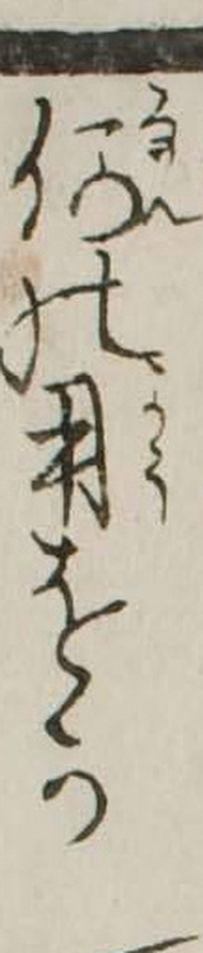何の用をか
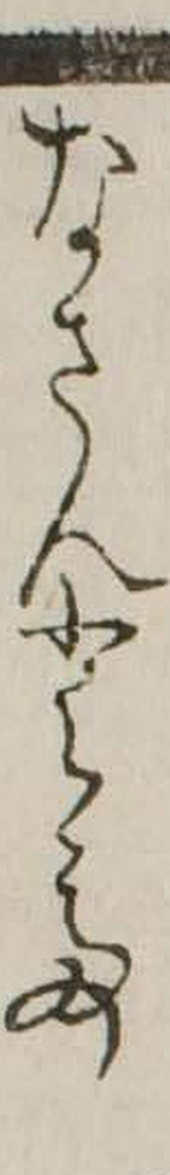なさんとて
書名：繪本不盡泉
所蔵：国文学研究資料館
